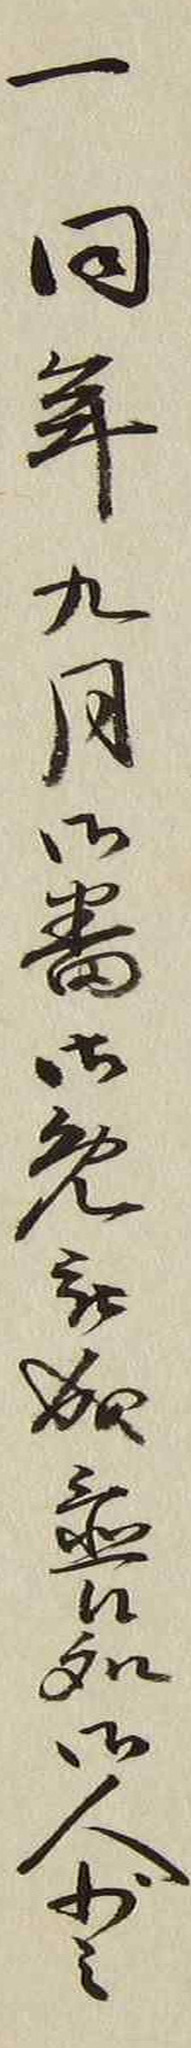一同年九月御番御免被成置候処御人少之
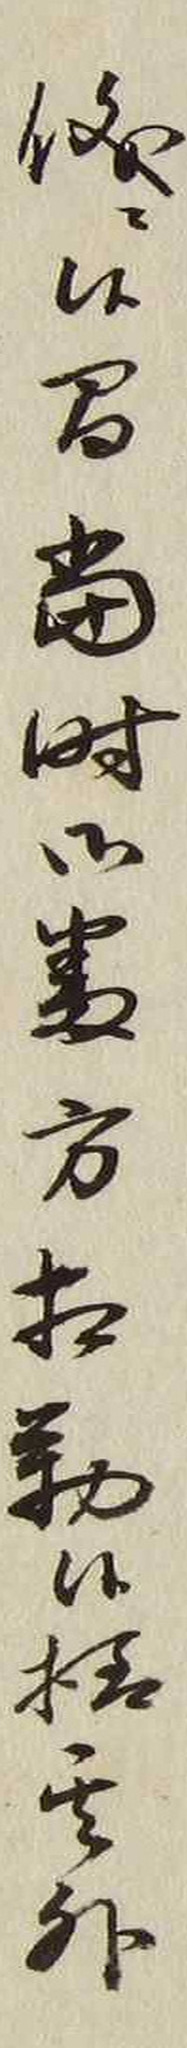儀ニ候間当時御番方相勤候様其外
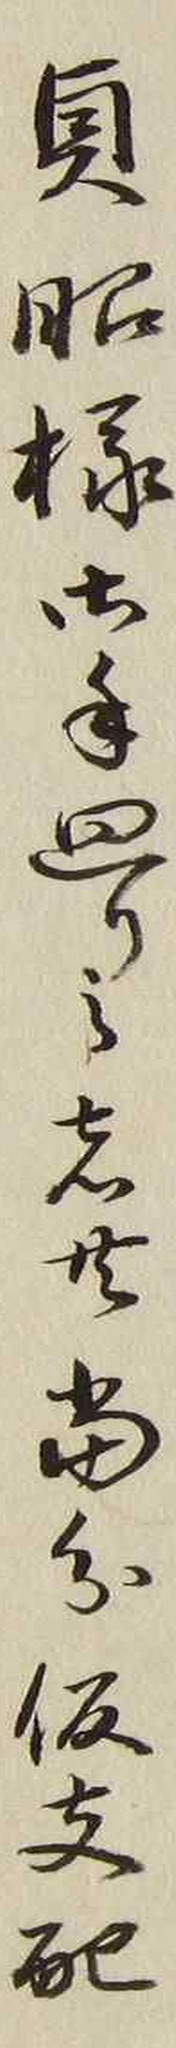貞昭様御手廻り之者共当分仮支配

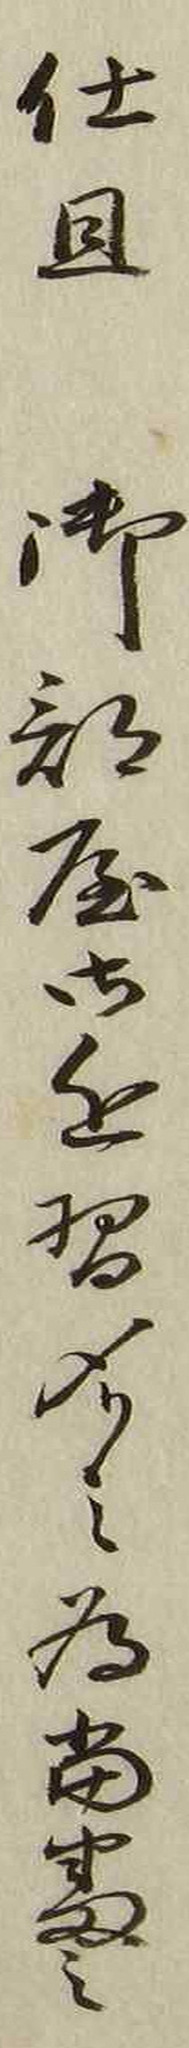仕且御部屋御近習〆り之為当番之
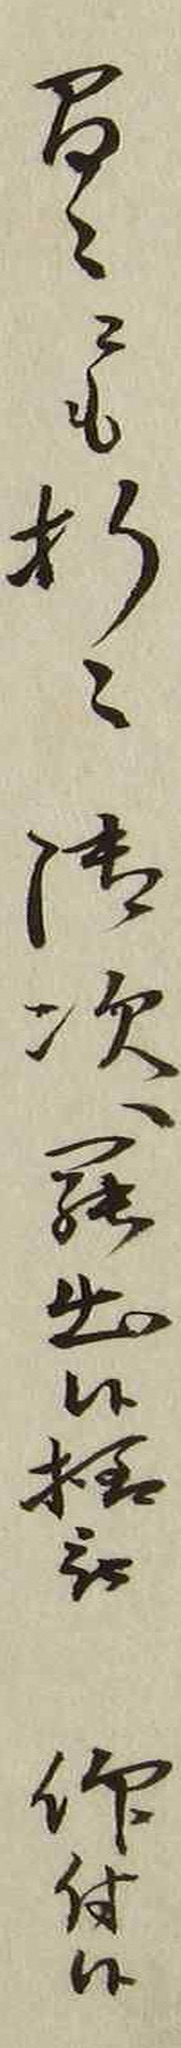間々ニも折々御次へ罷出候様被仰付候
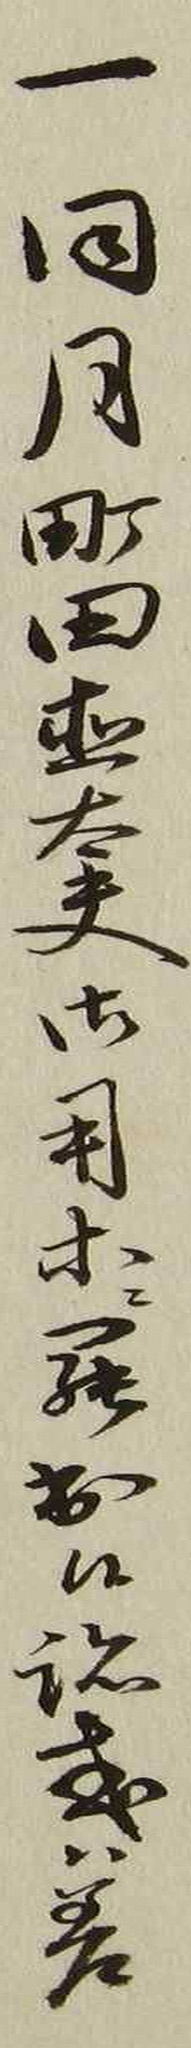一同月町田直太夫御用等ニ罷出候跡或ハ差
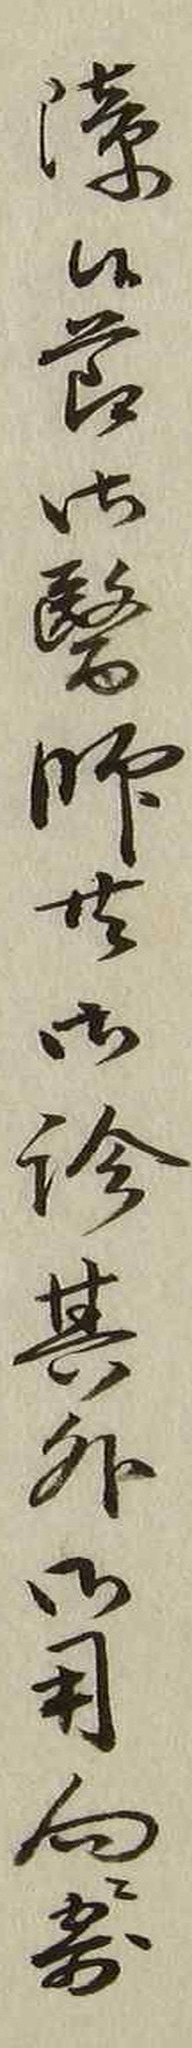障候節御医師共御診其外御用向ニ寄
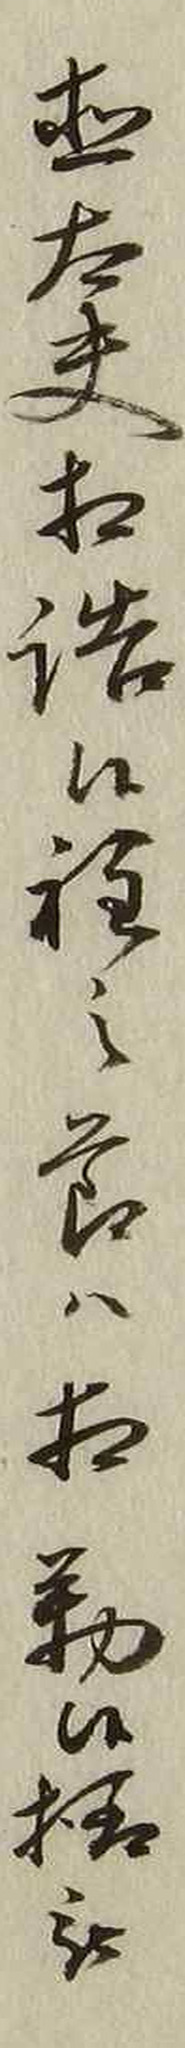直太夫相詰候程之節ハ相勤候様被
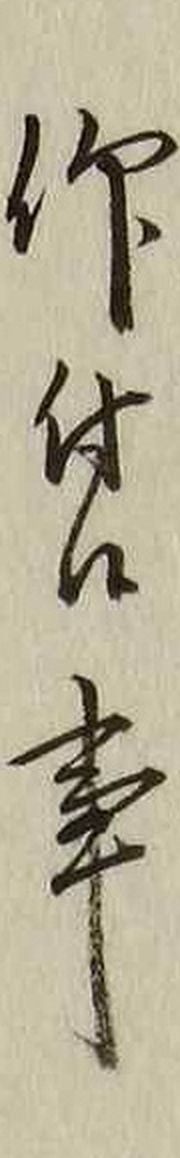仰付候事
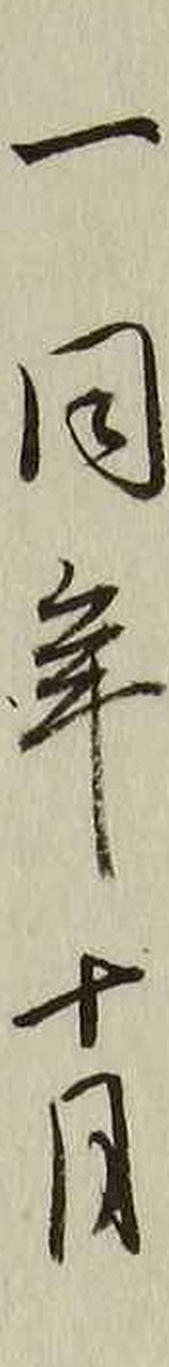一同年十月
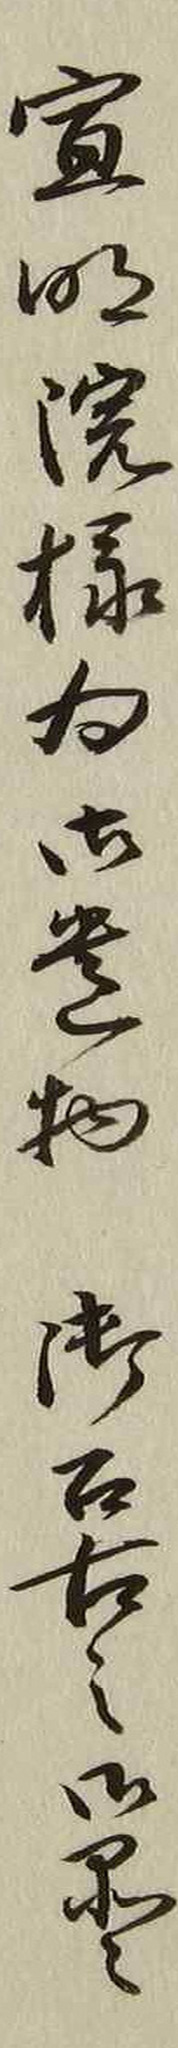宣明院様為御遺物御召古之御品々
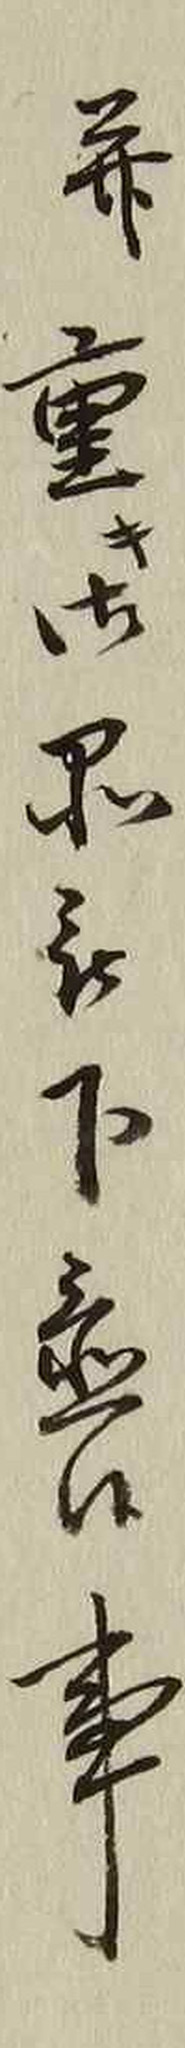并重キ御品被下置候事
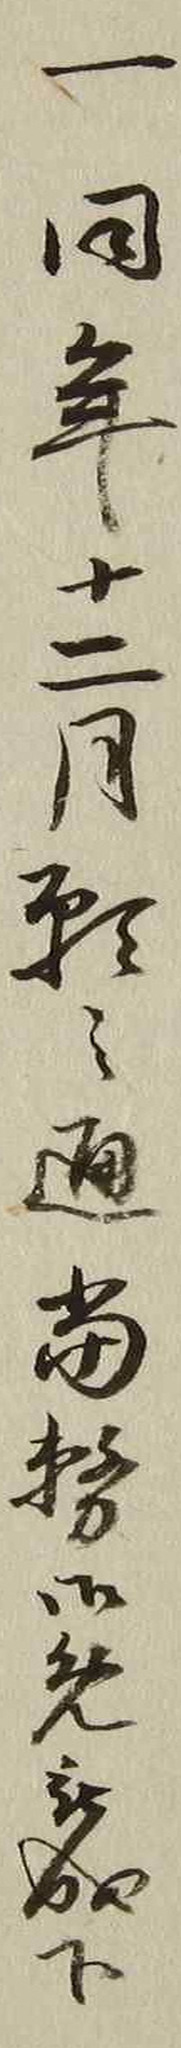一同年十二月願之通当務御免被成下
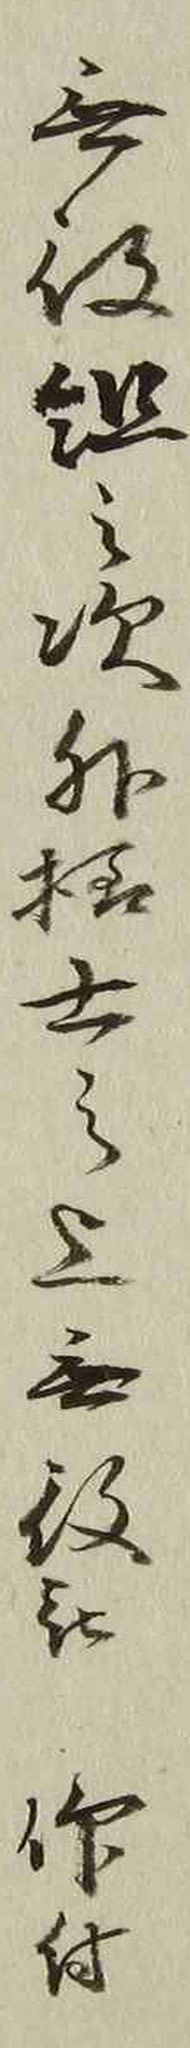無役組之次外様士之上無役被仰付
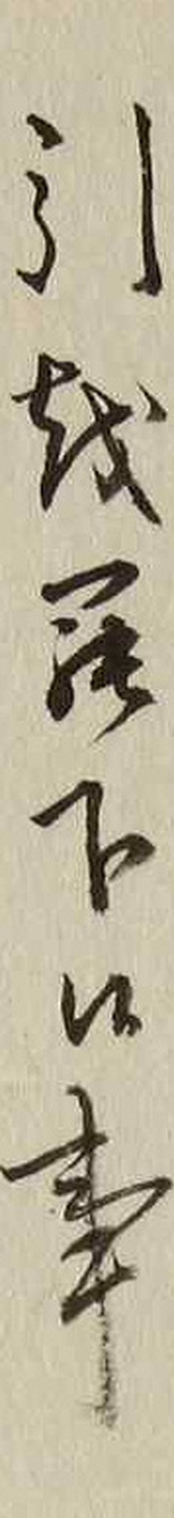引越罷下候事
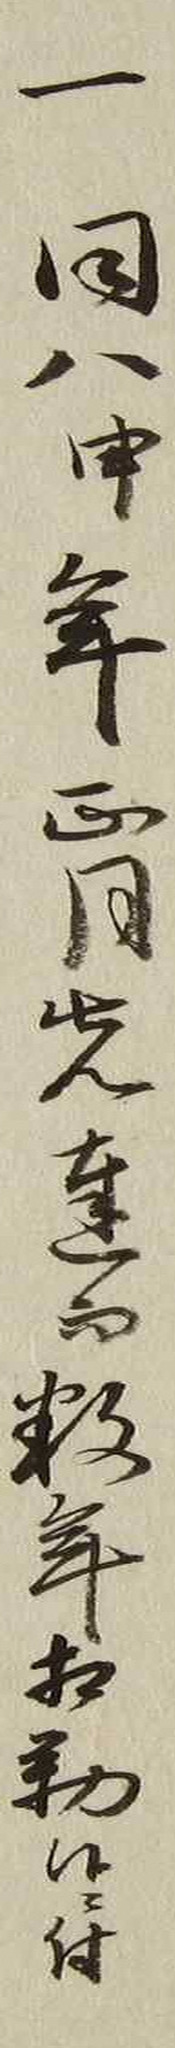一同八申年正月先達而数年相勤候ニ付
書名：諸士系譜　巻之160　な之部2
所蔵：会津若松市立会津図書館
